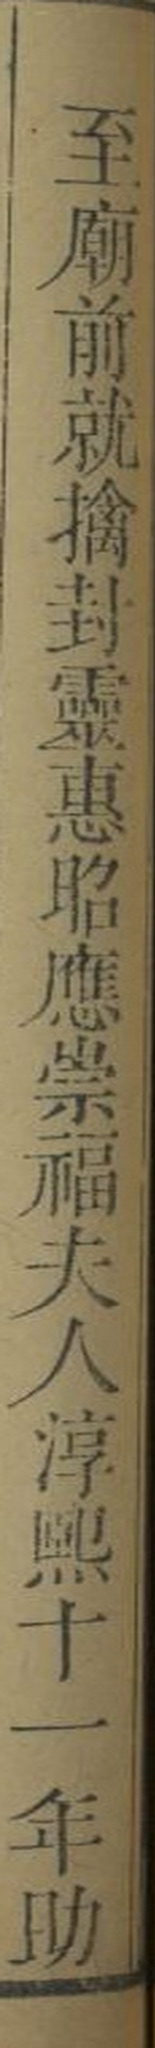至廟前就擒封靈惠昭應崇福夫人淳熙十一年助
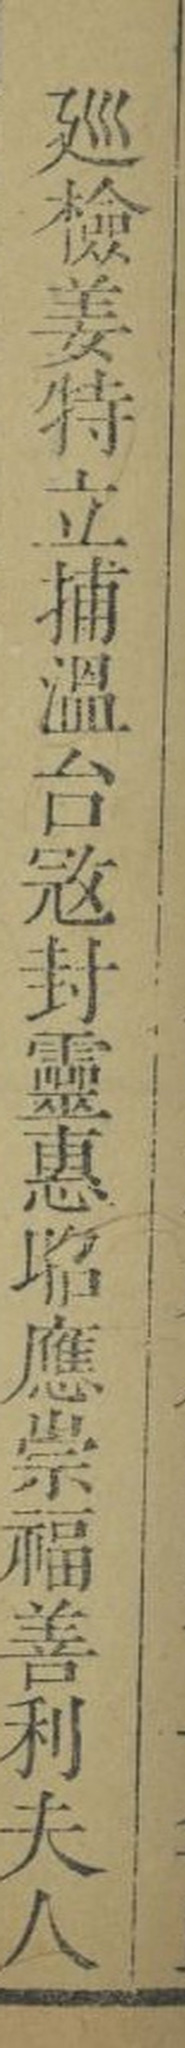廵檢姜特立捕溫台冦封靈惠昭應崇福善利夫人
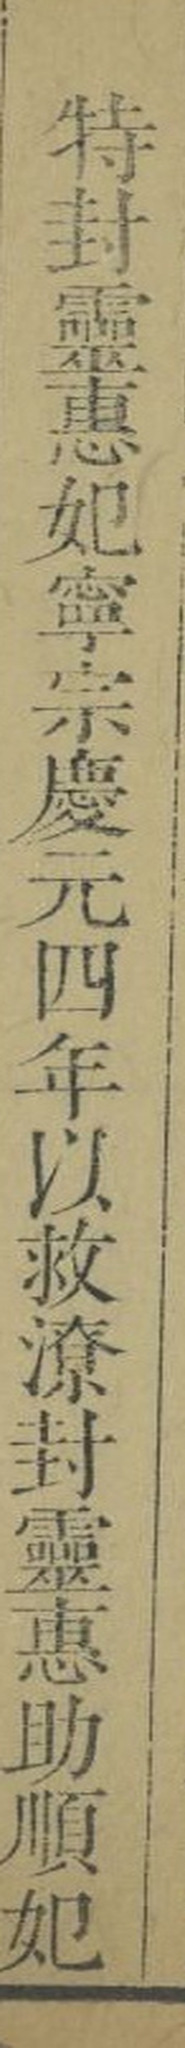特封靈惠妃寧宗慶元四年以救潦封靈惠助順妃
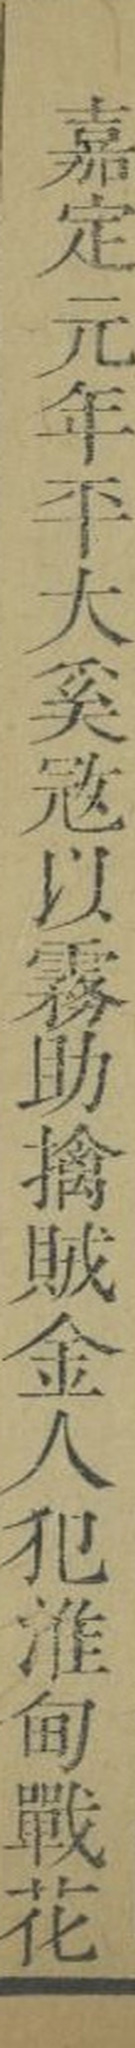嘉定元年平大奚冦以霧助擒賊金人犯淮甸戰花
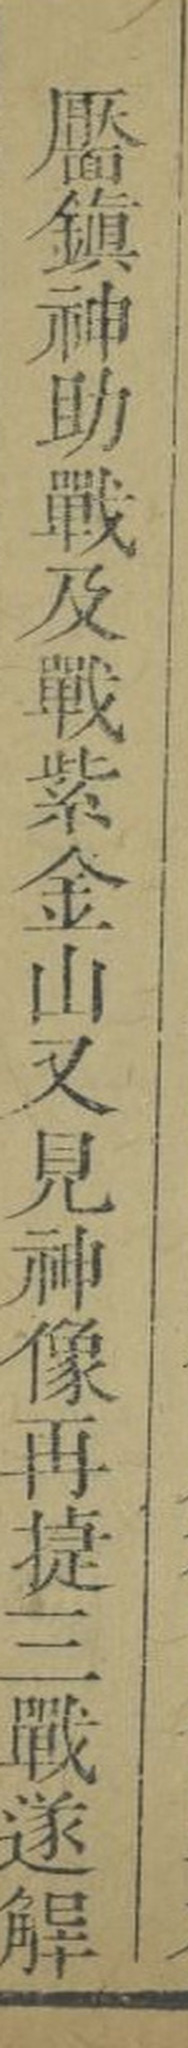靨鎭神助戰及戰紫金山又見神像再㨗三戰遂解
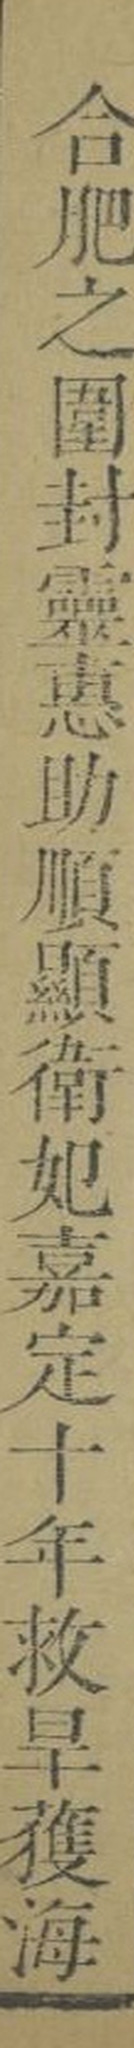合肥之圍封靈惠助順顯衛妃嘉定十年救旱獲海
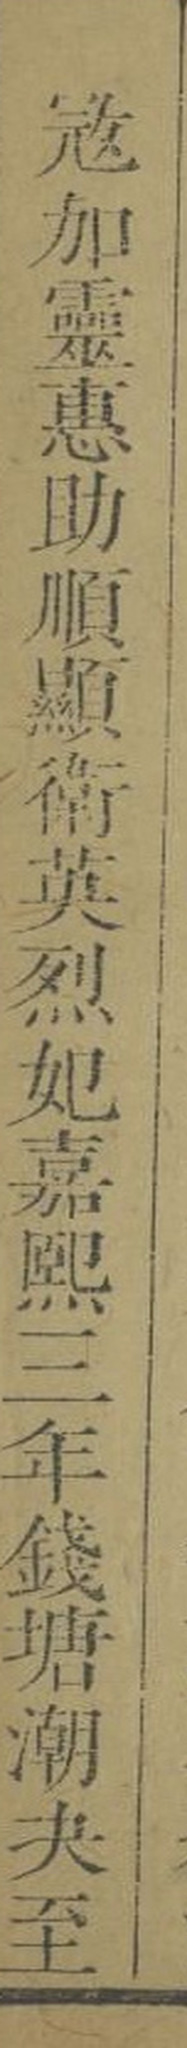冦加靈惠助順顯衛英烈妃嘉熙三年錢塘潮决至

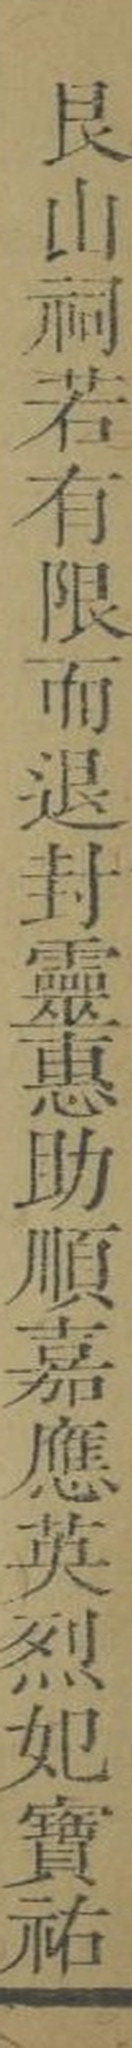艮山祠若有限而退封靈惠助順嘉應英烈妃寶祐
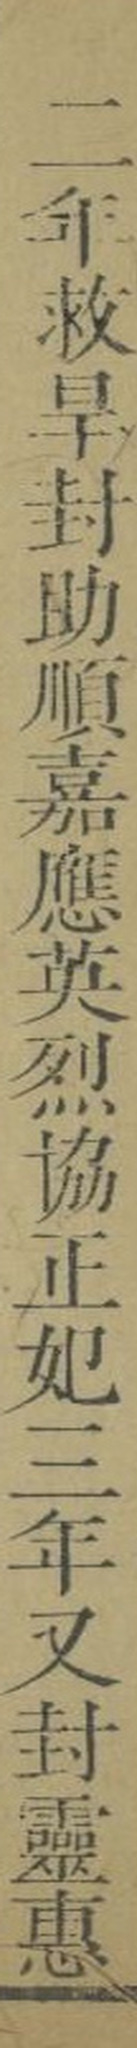二年救旱封助順嘉應英烈協正妃三年又封靈惠
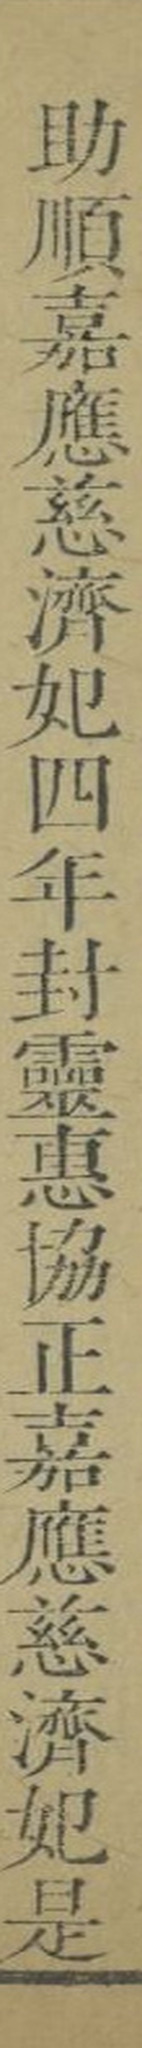助順嘉應慈濟妃四年封靈惠協正嘉應慈濟妃是
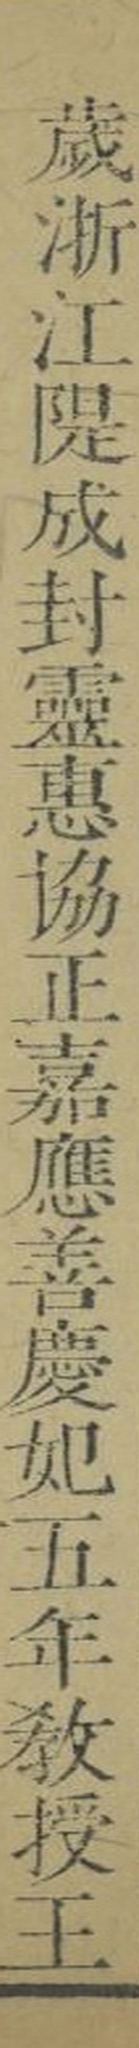歲浙江隄成封靈惠協正嘉應善慶妃五年敎授王
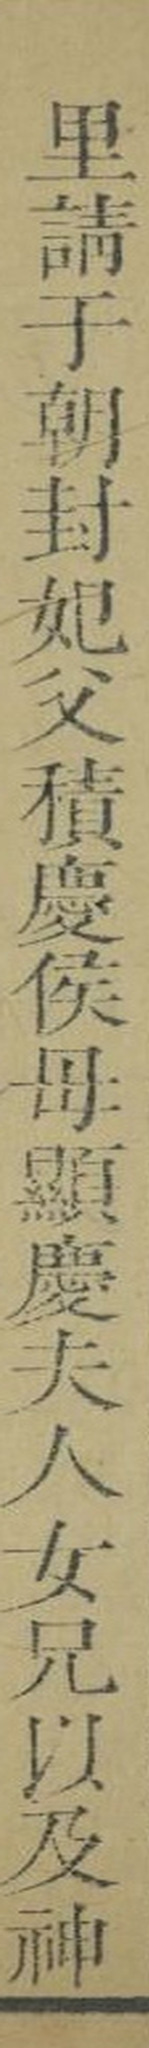里請于朝封妃父積慶侯母顯慶夫人女兄以及神
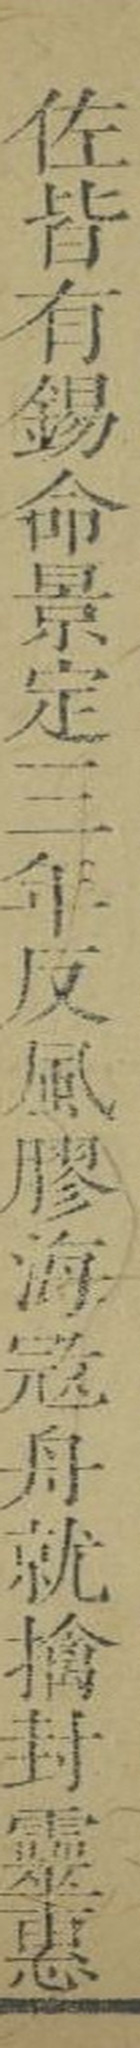佐皆有錫命景定三年反風膠海冦舟就擒封靈惠
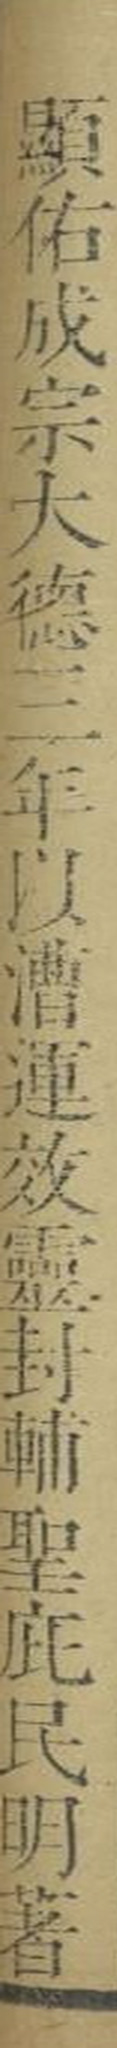顯佑成宗大德三年以漕運效靈封輔聖庇民明著
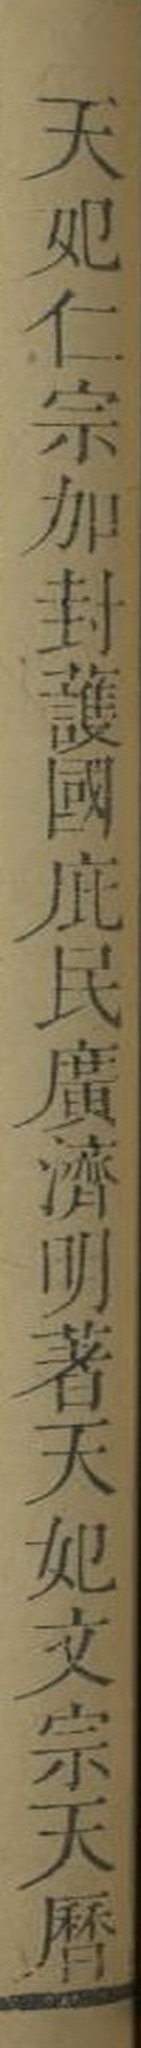天妃仁宗加封䕶國庇民廣濟明著天妃文宗天曆
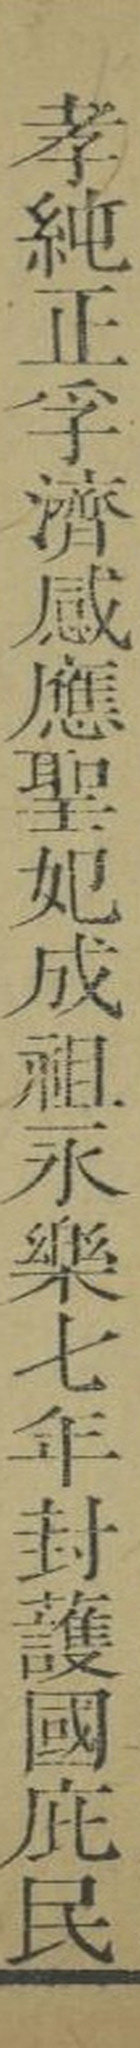孝純正孚濟感應聖妃成祖永樂七年封䕶國庇民
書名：中山伝信録 巻一
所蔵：University of the Ryukyus Library
